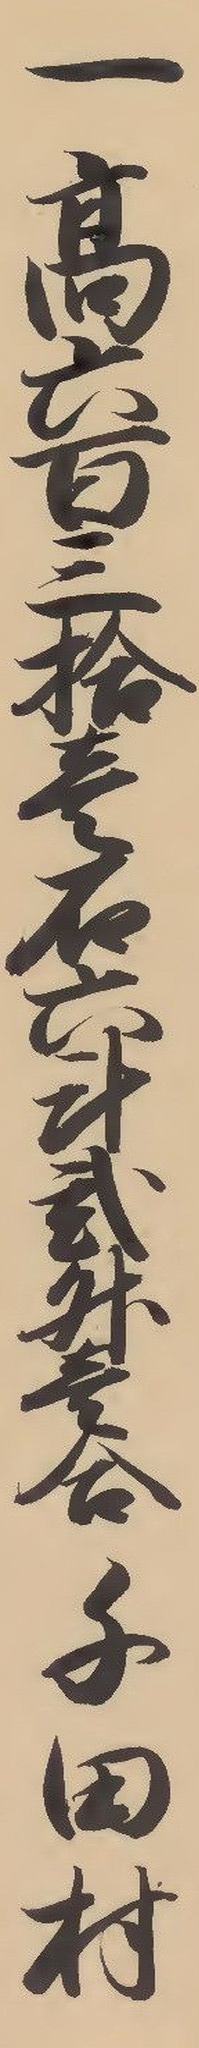一高六百三拾壱石六斗弐升壱合千田村
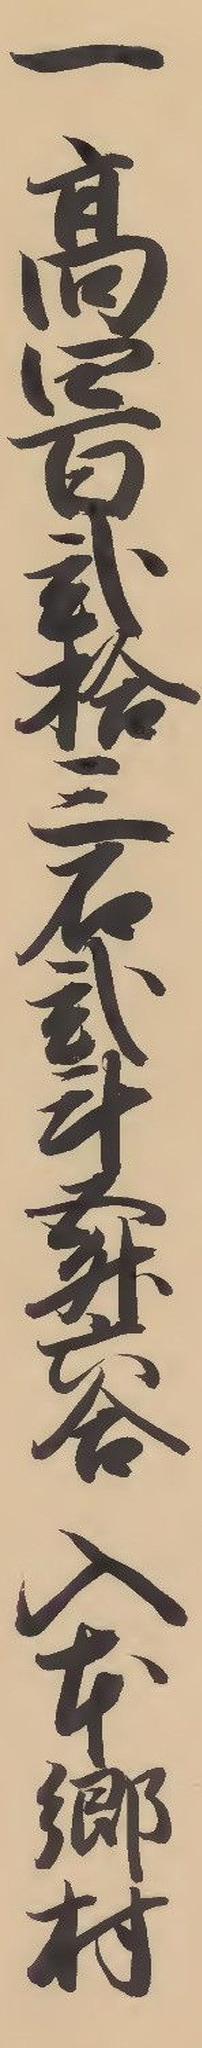一高四百弐拾三石弐斗五升六合入本郷村

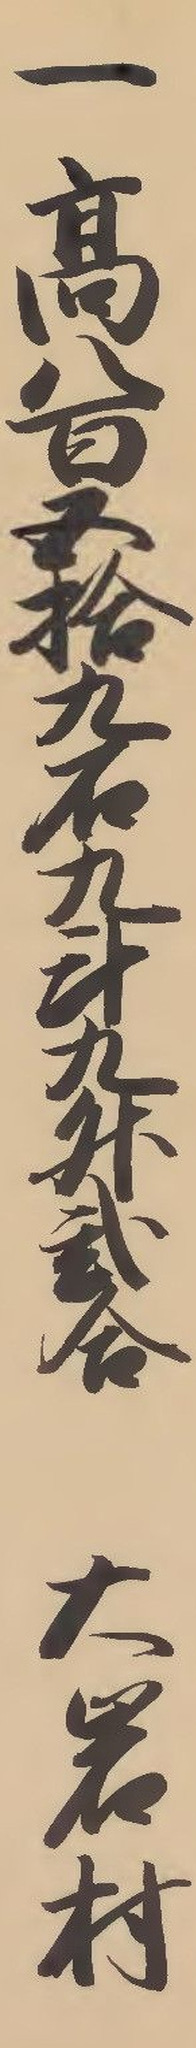一高八百五拾九石九斗九升弐合大岩村
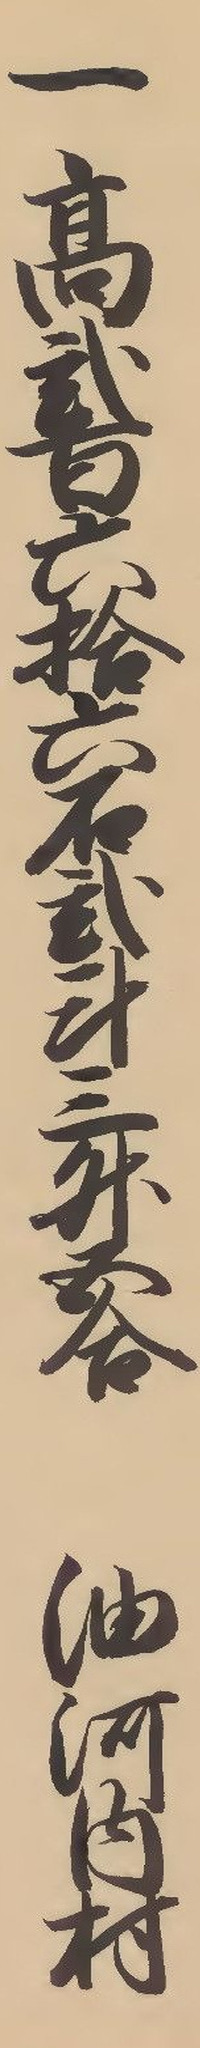一高弐百六拾六石弐斗三升五合油河内村
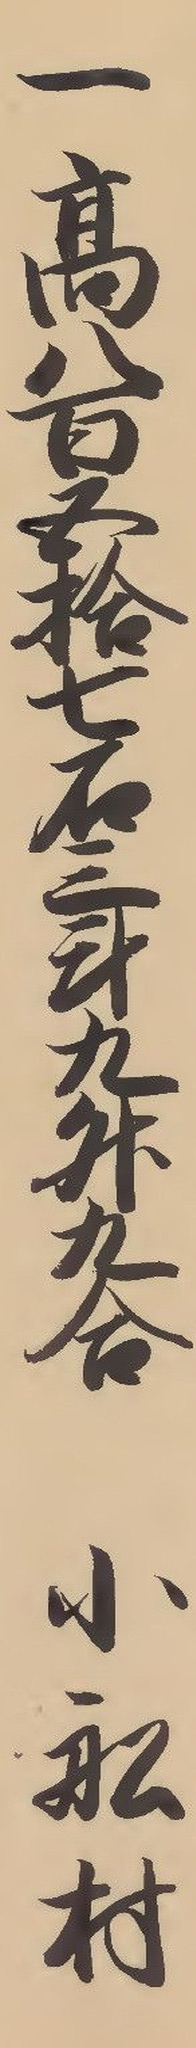一高八百五拾七石三斗九升九合小船村
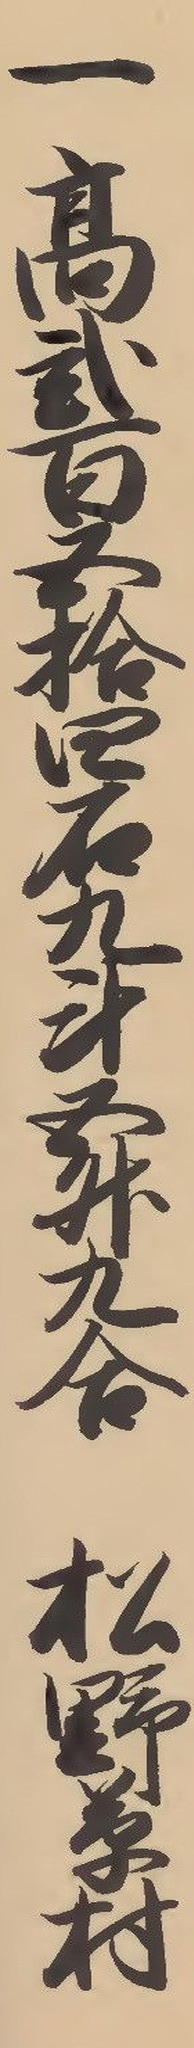一高弐百五拾四石九斗五升九合松野草村
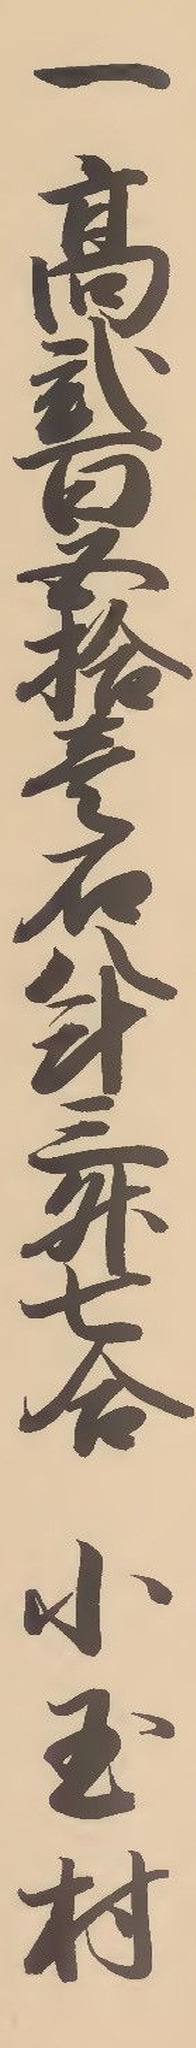一高弐百五拾壱石八斗三升七合小玉村
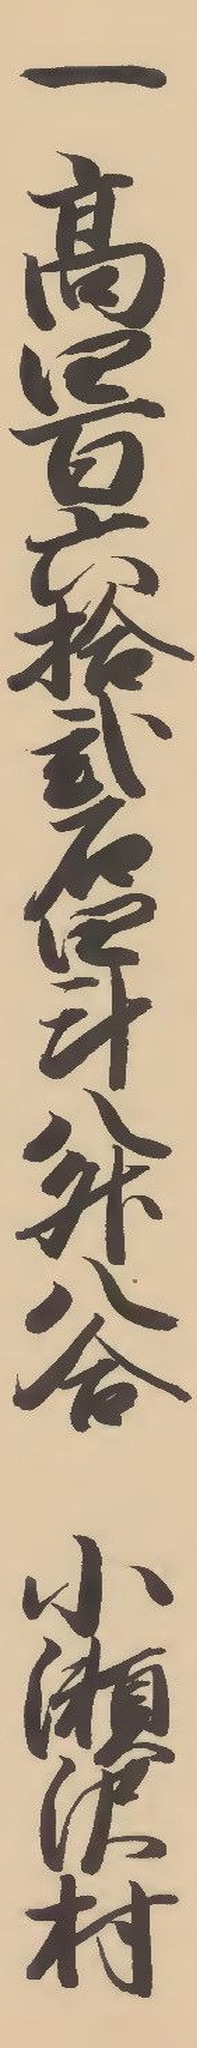一高四百六拾弐石四斗八升八合小瀬沢村
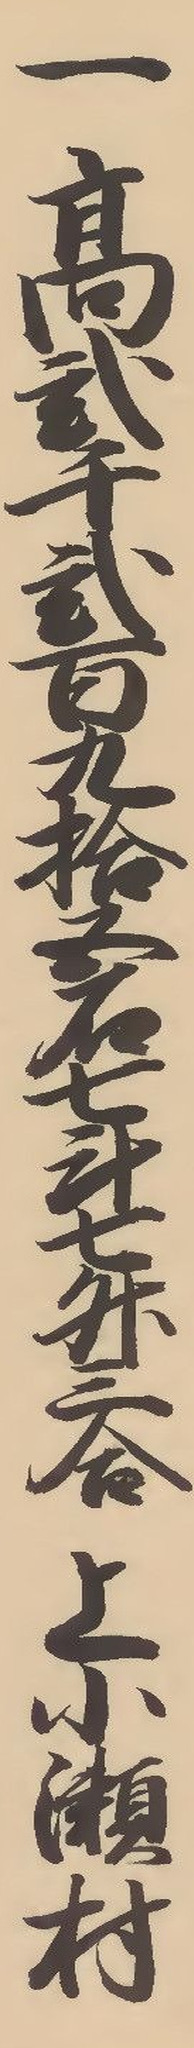一高弐千弐百九拾五石七斗七升三合上小瀬村
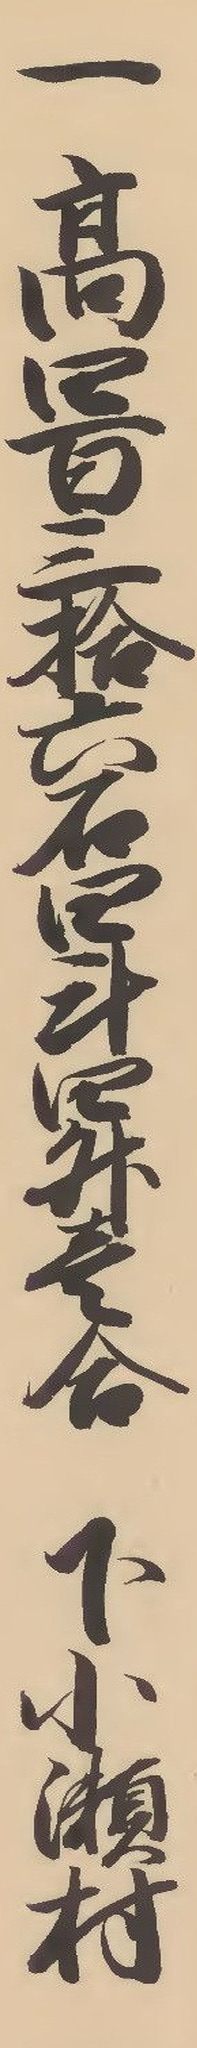一高四百三拾六石四斗四升壱合下小瀬村

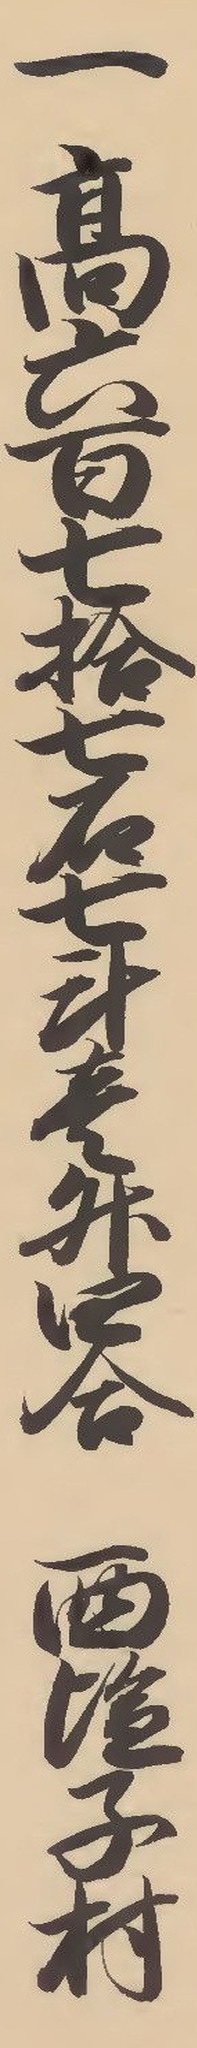一高六百七拾七石七斗壱升四合西塩子村
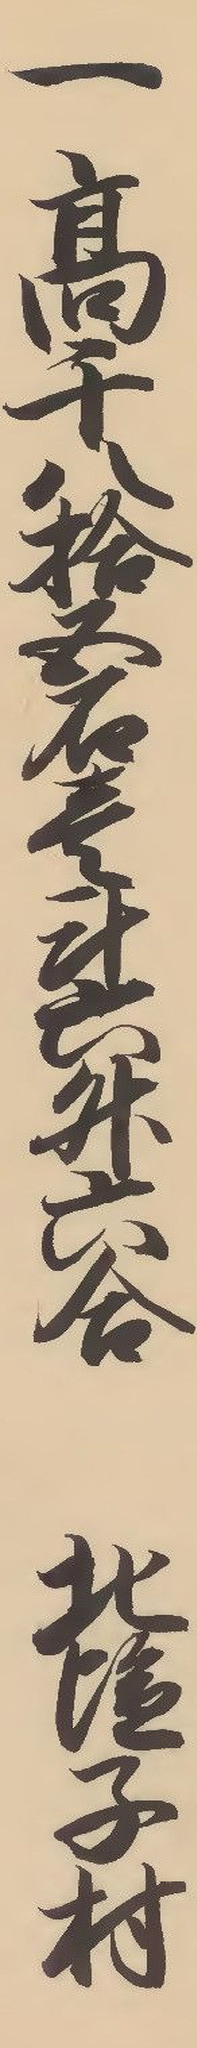一高千八拾五石壱斗六升六合北塩子村
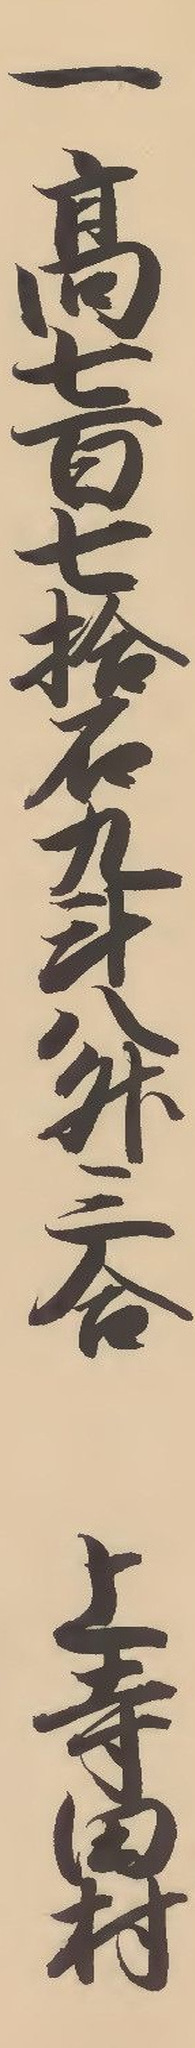一高七百七拾石九斗八升三合上寺田村
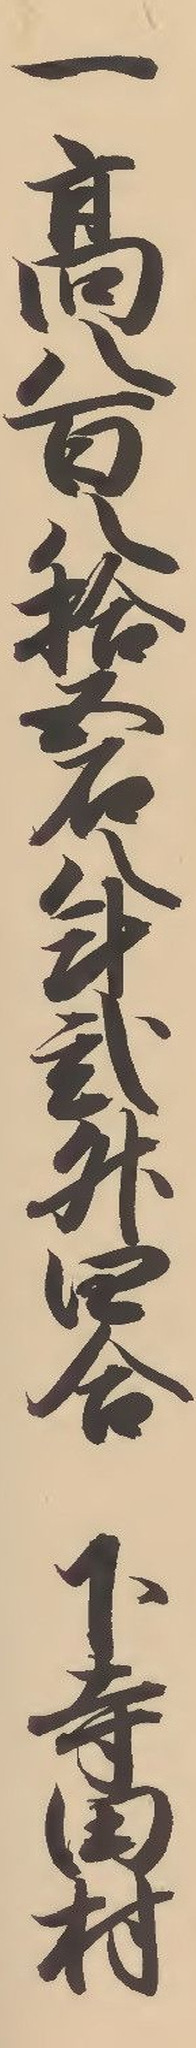一高八百八拾五石八斗弐升四合下寺田村
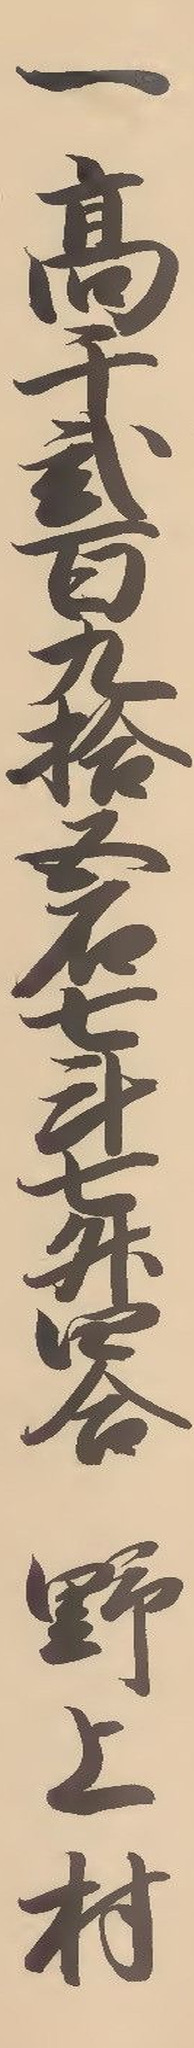一高千弐百九拾五石七斗七升四合野上村
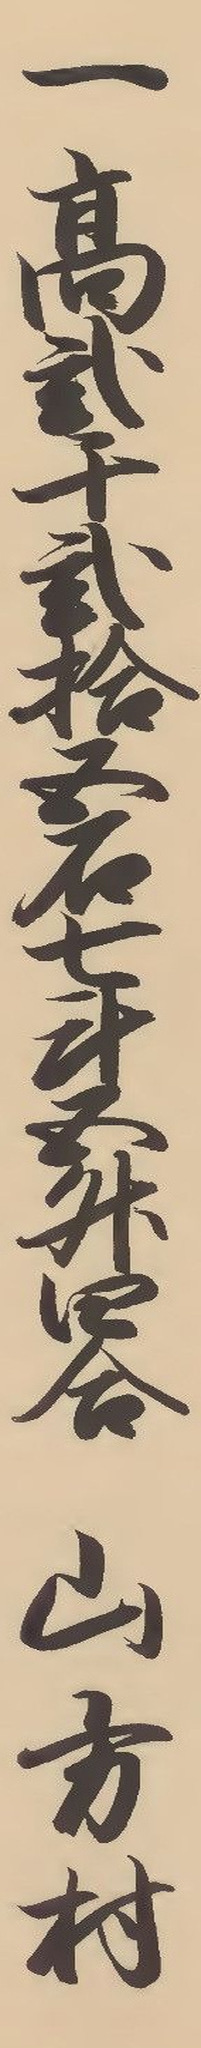一高弐千弐拾五石七斗五升四合山方村
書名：常陸国郷帳
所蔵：国立公文書館 National Archives of Japan
